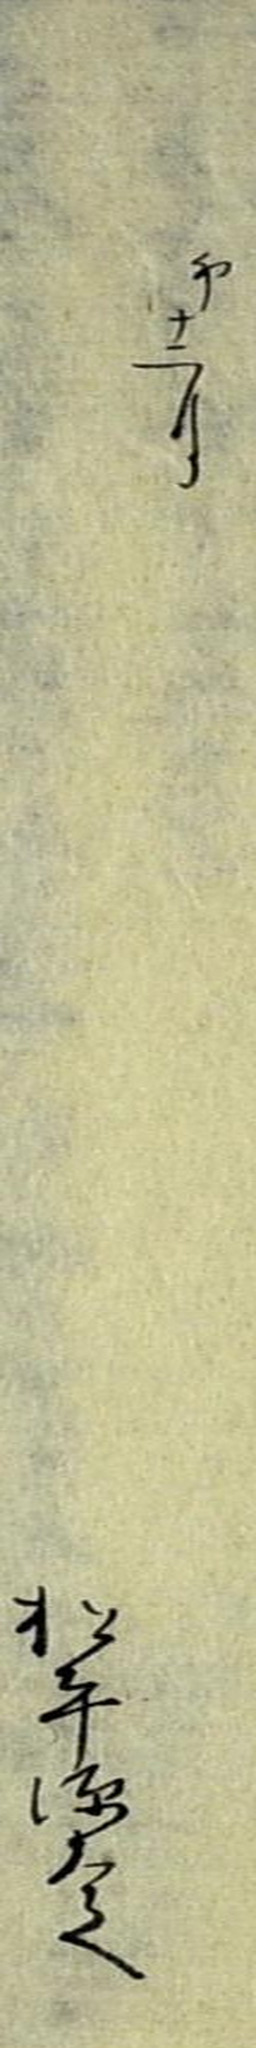松平源大夫
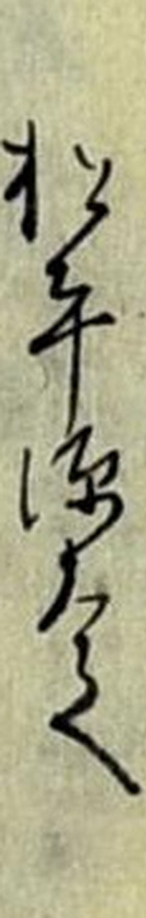松平源大夫
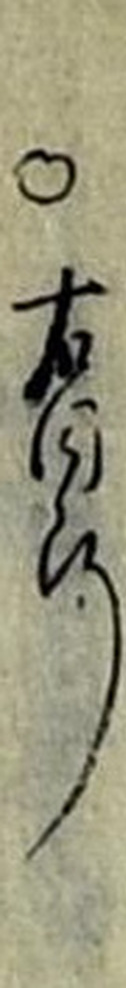〇右同断
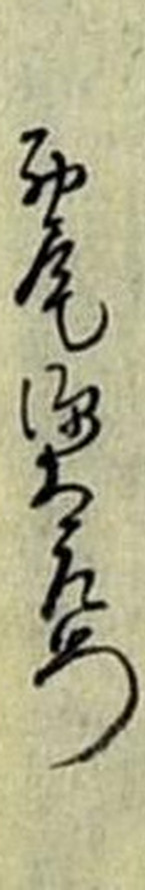西尾源太左衛門
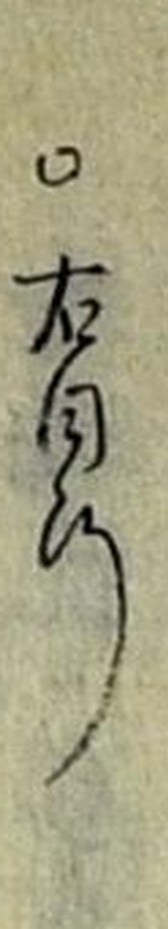〇右同断
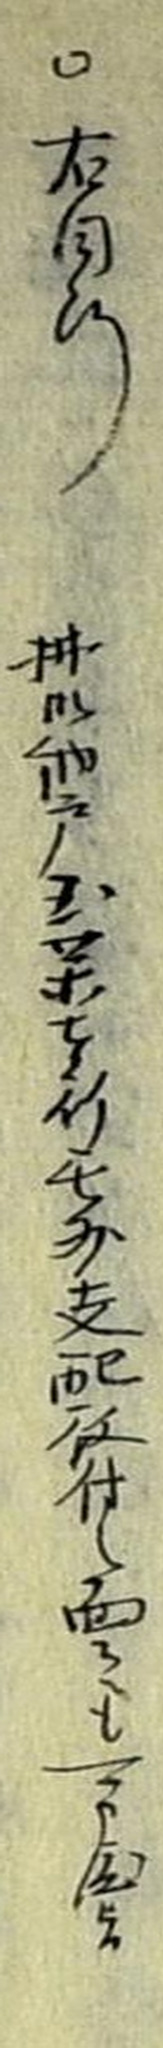〇右同断払御納戸玉薬奉行其外支配役付之面々へも可申渡旨
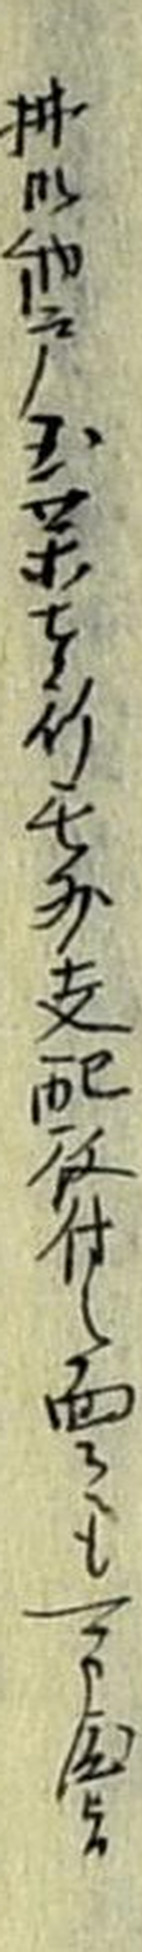〇右同断払御納戸玉薬奉行其外支配役付之面々へも可申渡旨
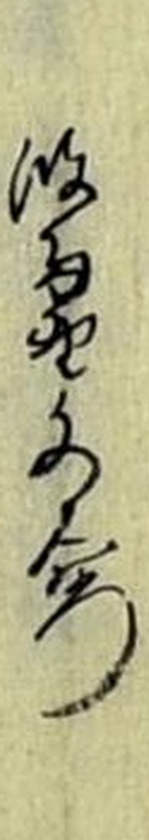波多野文右衛門
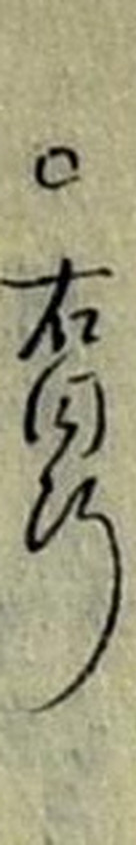〇右同断
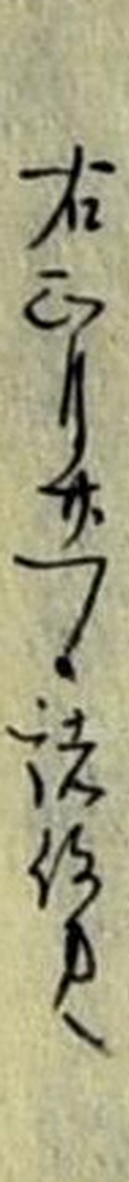右正月廿一日諸役方へ

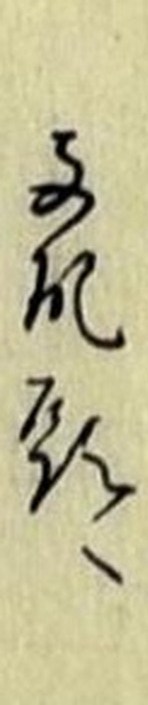支配頭へ
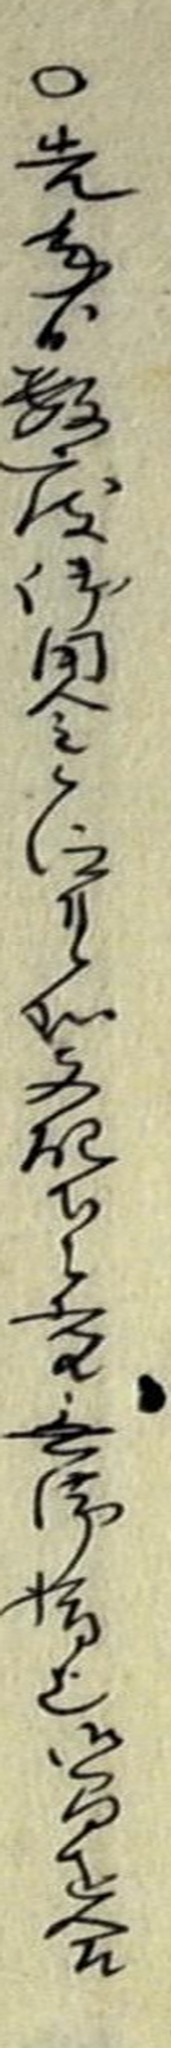〇先年ゟ数度御用金被仰付候処支配下之者共無滞指上御間を合
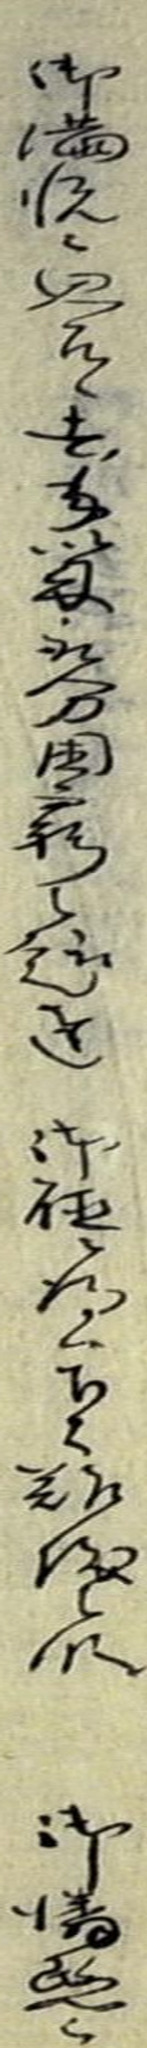御満悦ニ思召候去年以来取分困窮之趣達御聴候得ハ下々難儀之段御憐愍被
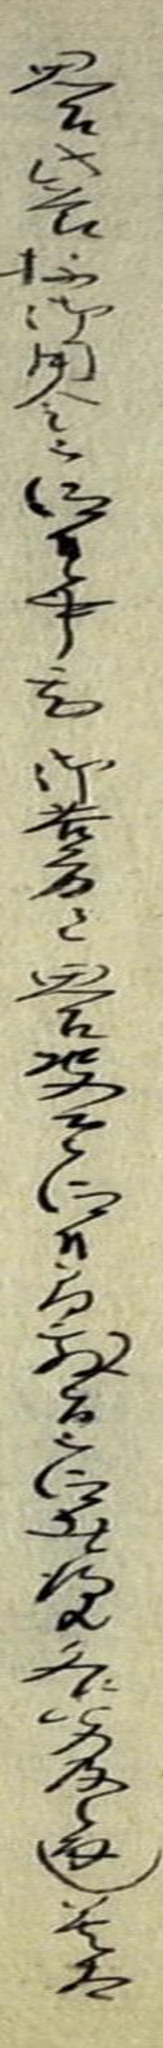思召此節抔御用金被仰付候事甚御苦労ニ被思召決而被仰付間敷旨被仰出候得共各聞及之通莫太
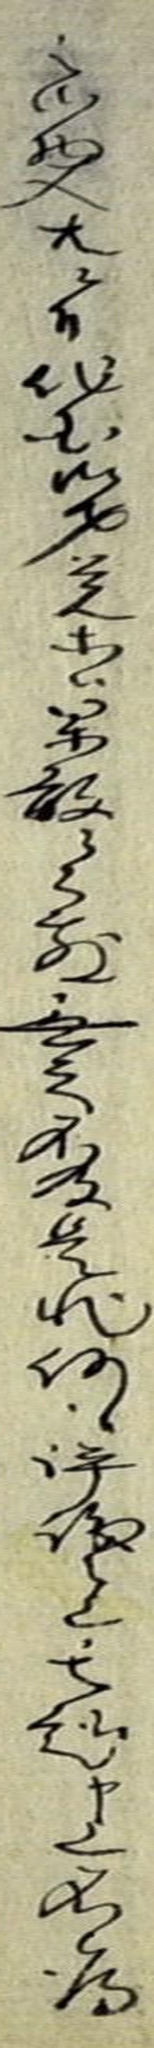之御物入共ニ付他国御才覚等ハ果敢々々敷無之不及是非何も評議之上其趣申上不被得
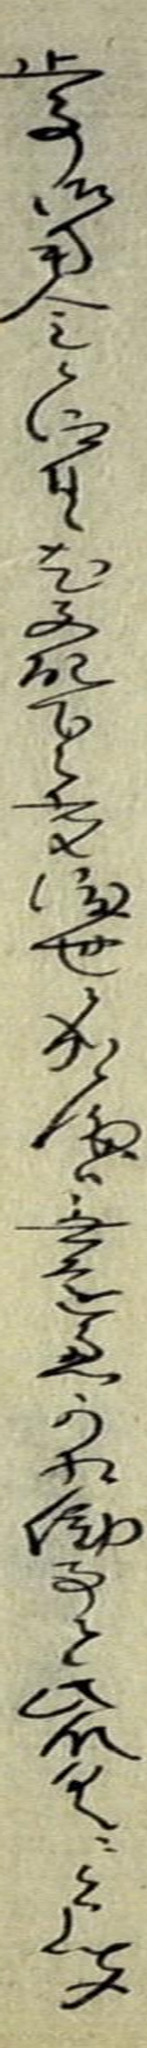止事御用金被仰付候尤支配下之者共渡世ニ成候儀ハ無遠慮可相働事ニ候此段具ニ被申聞
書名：命令之部 一
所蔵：福井県文書館 Fukui Prefectural Archives
